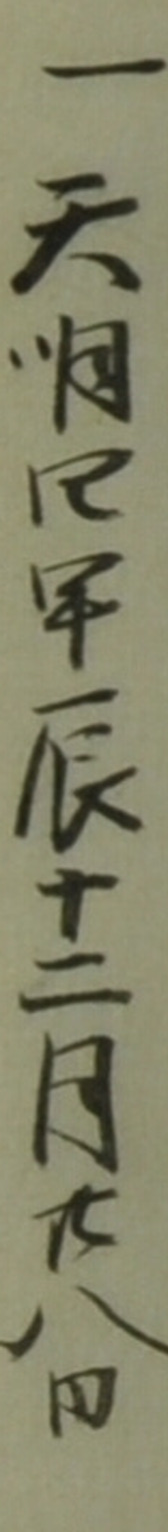一天明四甲辰十二月廿八日

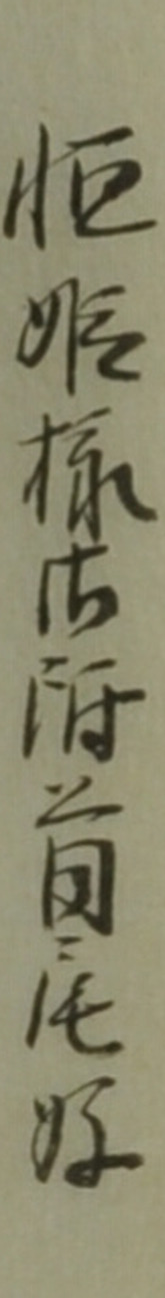恒姫様御附首尾好
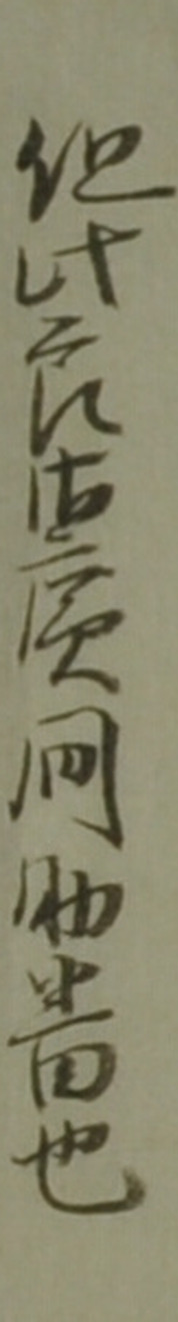但此節御広間助番也
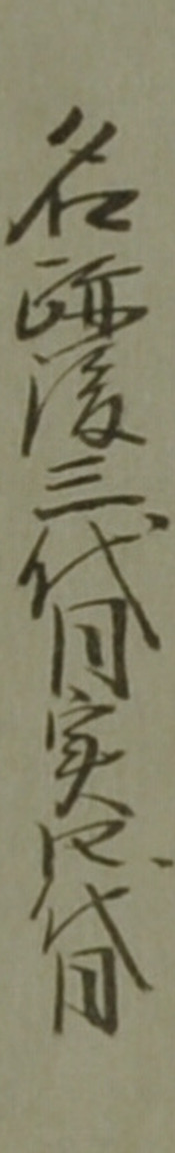名跡後三代目実四代目
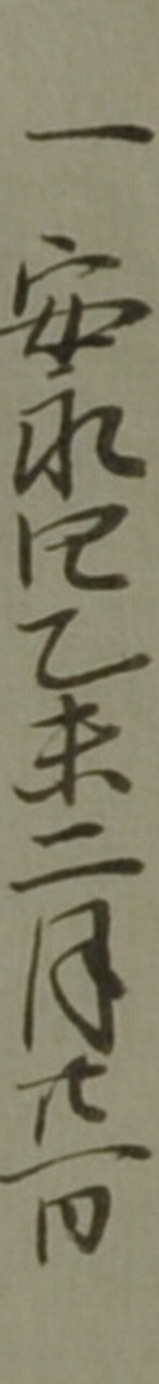一安永四乙未二月廿一日
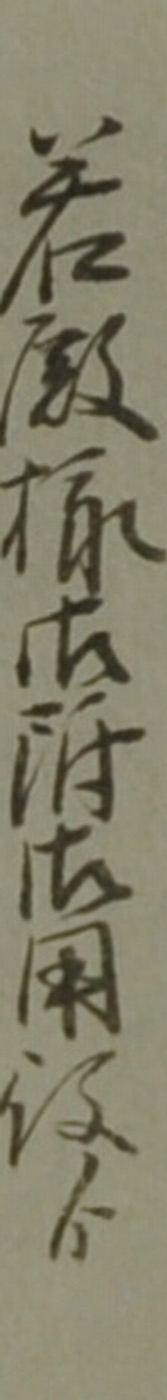若殿様御附御用役ゟ
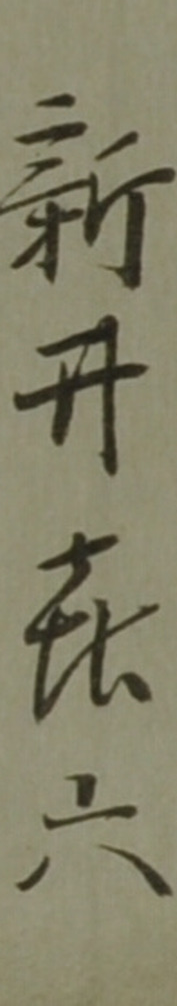新井喜六
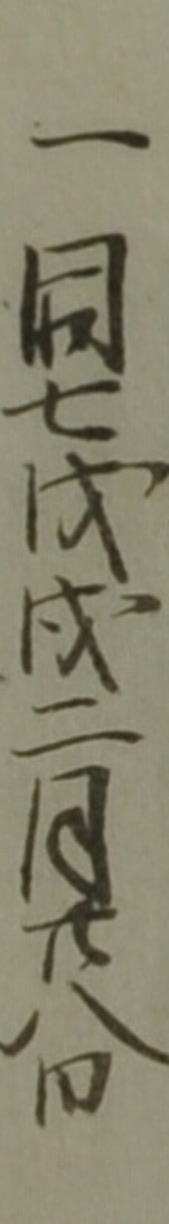一同七戊戌二月廿八日
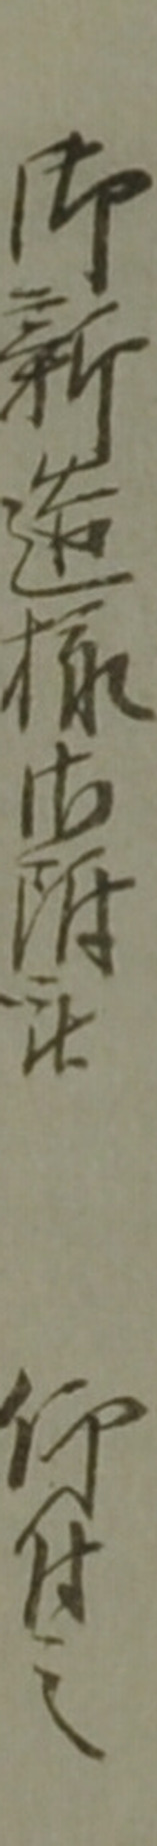御新造様御附被仰付之
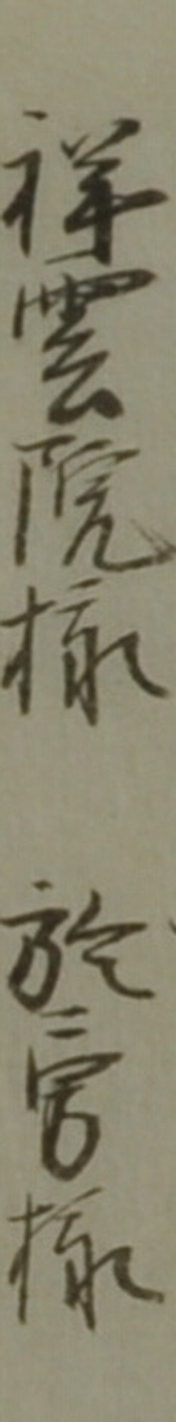祥雲院様於勇様
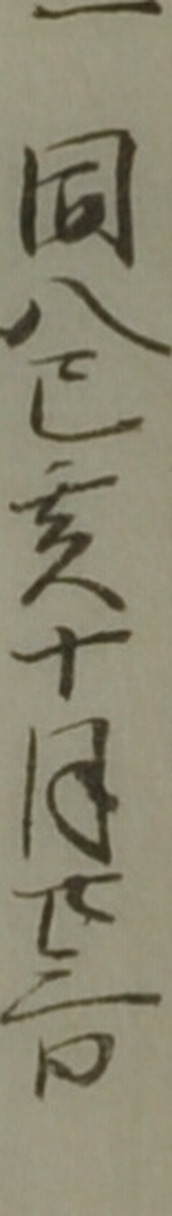一同八己亥十月廿二日
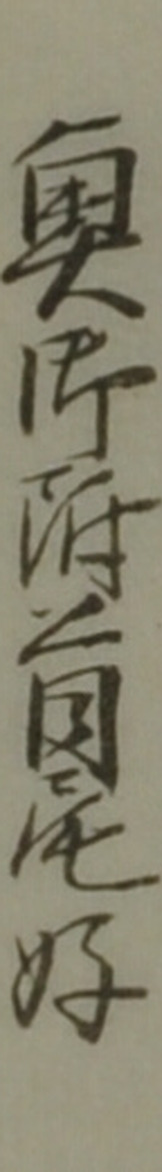奥御附首尾好
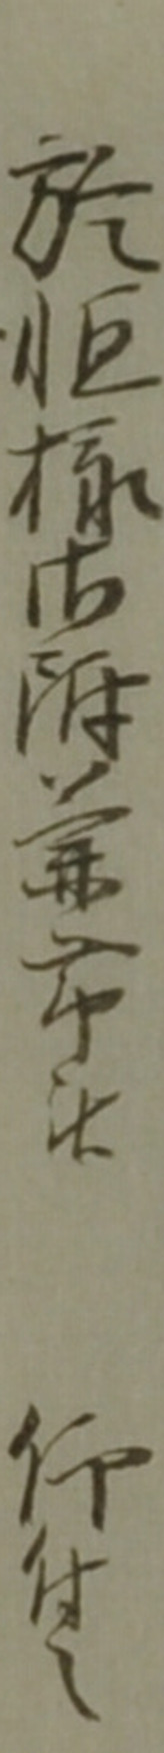於恒姫様御附兼帯被仰付之
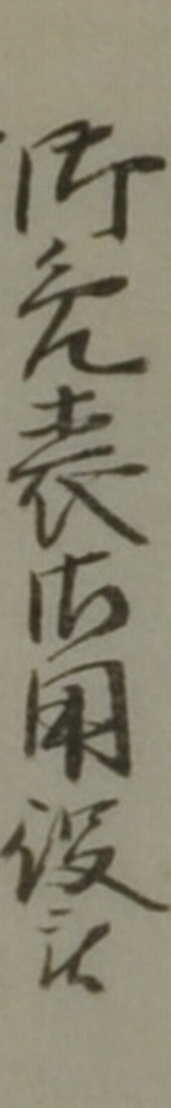御免表御用役被
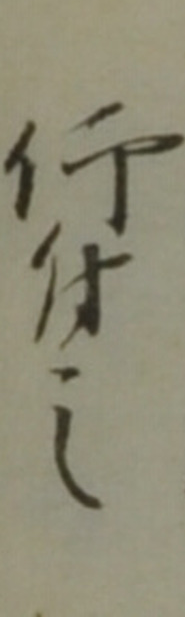仰付之
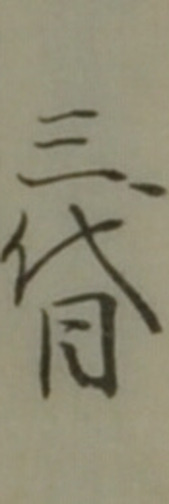三代目
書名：諸御役代々録（六）
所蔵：伊那市立高遠町図書館・合同会社AMANE
